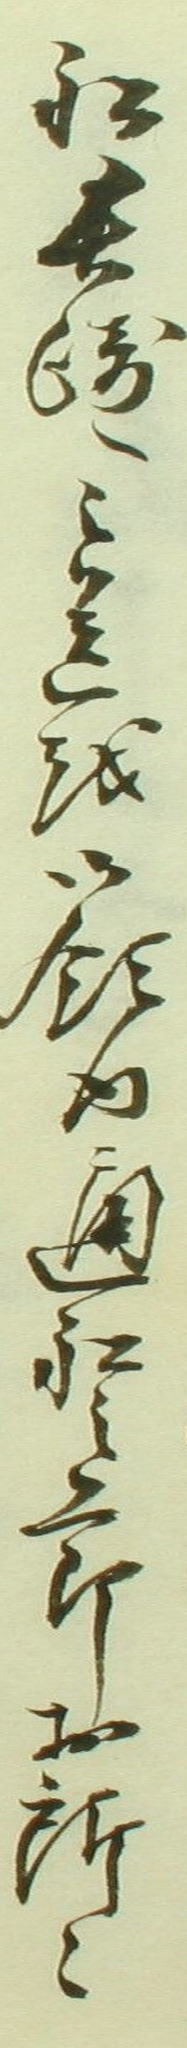船長崎へ被送越御領内通船之節於所々
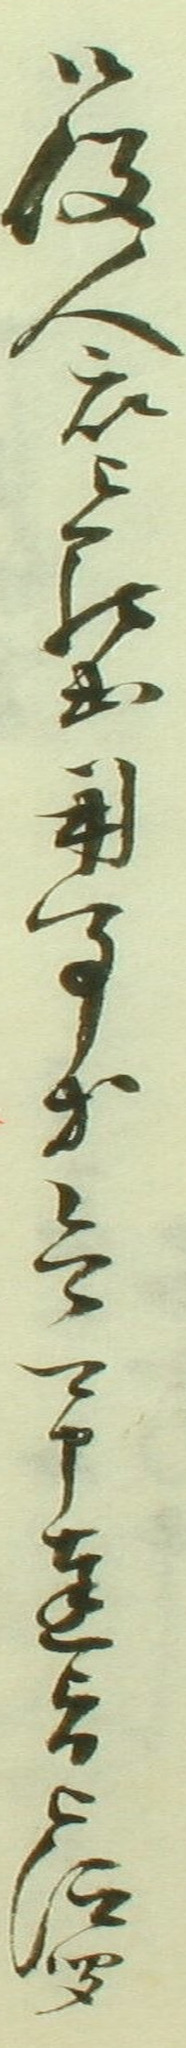御役人衆被罷出用事等候ハヽ可申達旨被仰聞
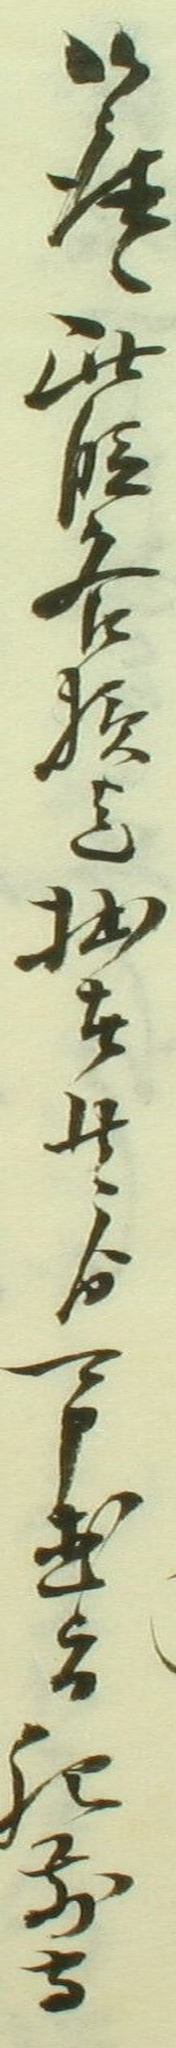御座候此段各様迄拙者共ゟ可申置旨肥前守
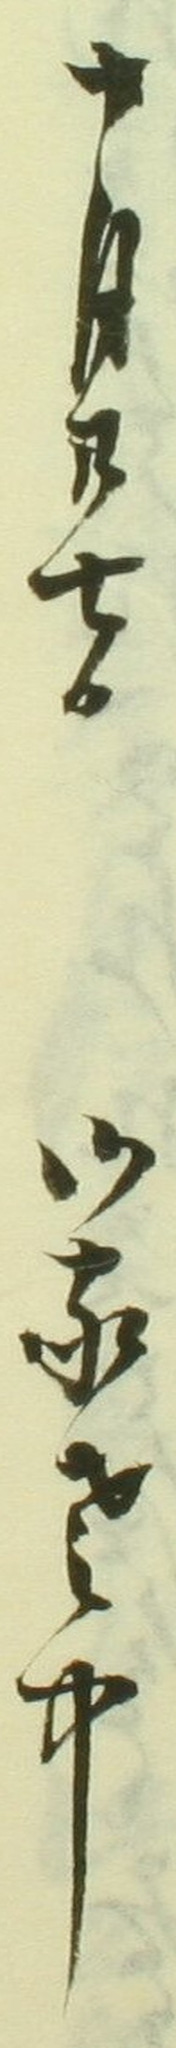十月廿七日御家老中
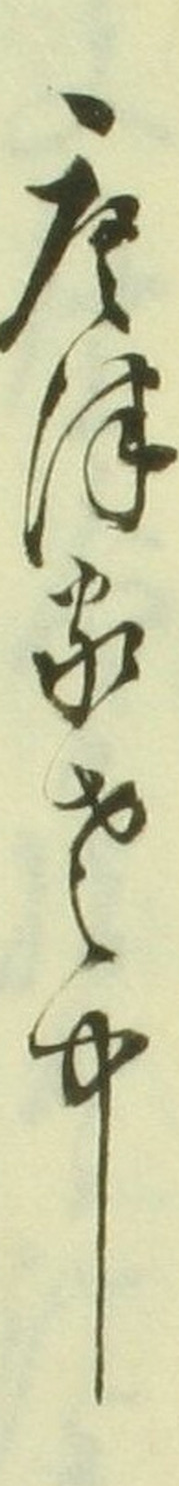唐津家老中
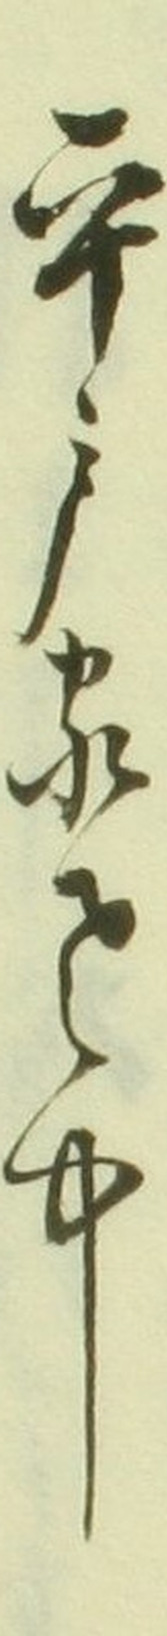平戸家老中
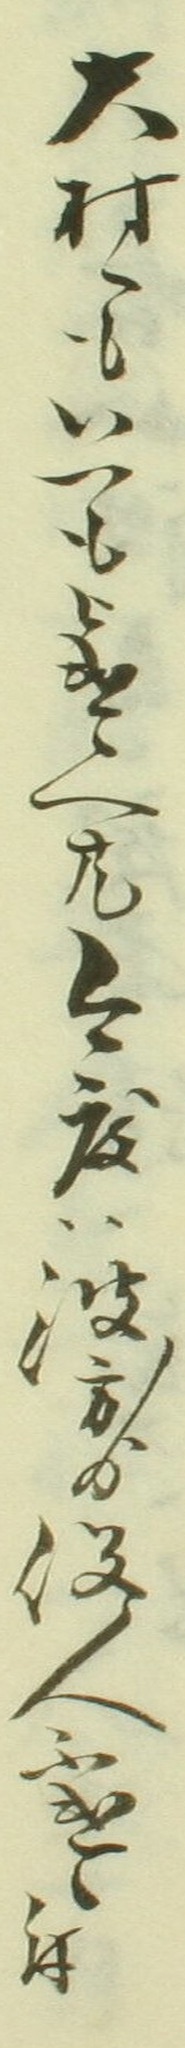大村へもいつも被遣候へ共今度ハ波方ゟ役人不遣候付
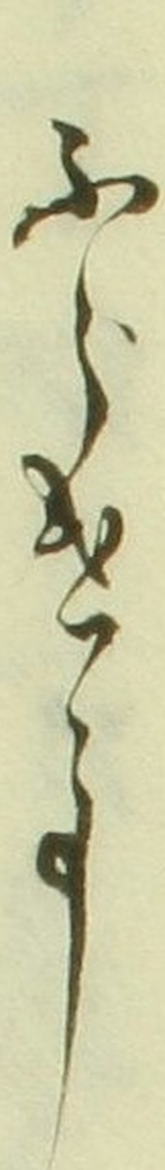不被遣事
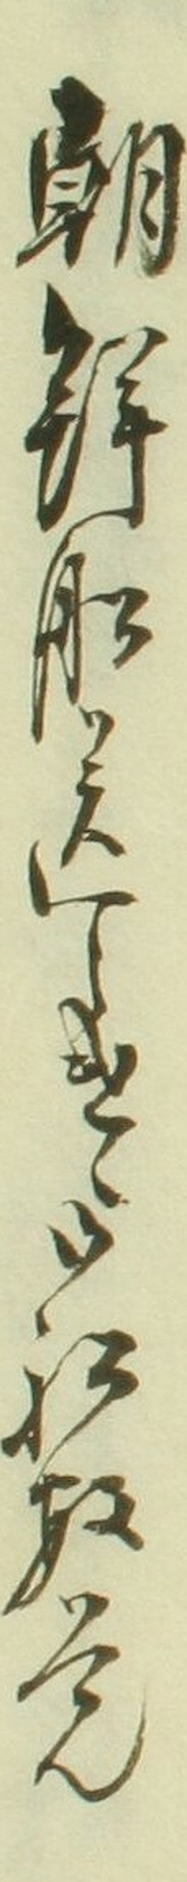朝鮮船送遣候御船数覚
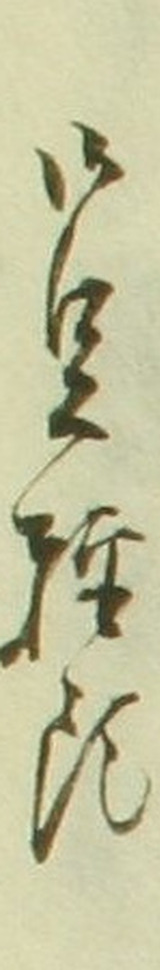御足軽頭
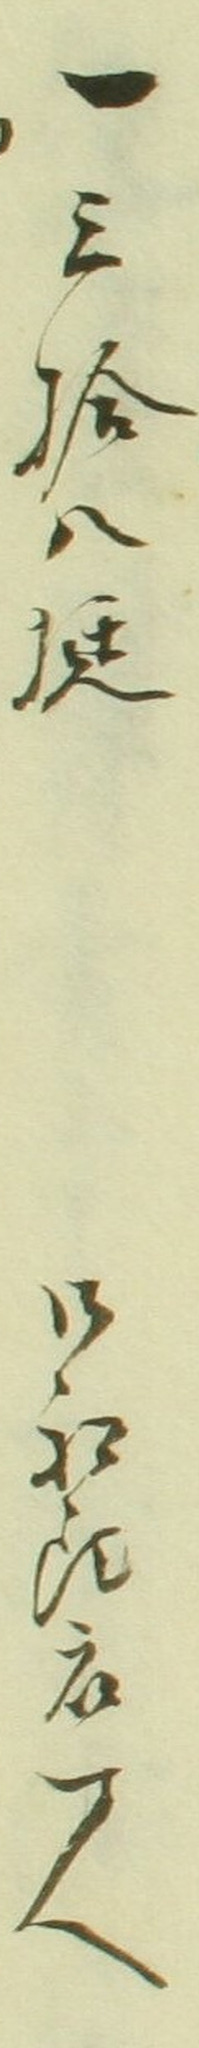一三拾八挺御船頭衆一人
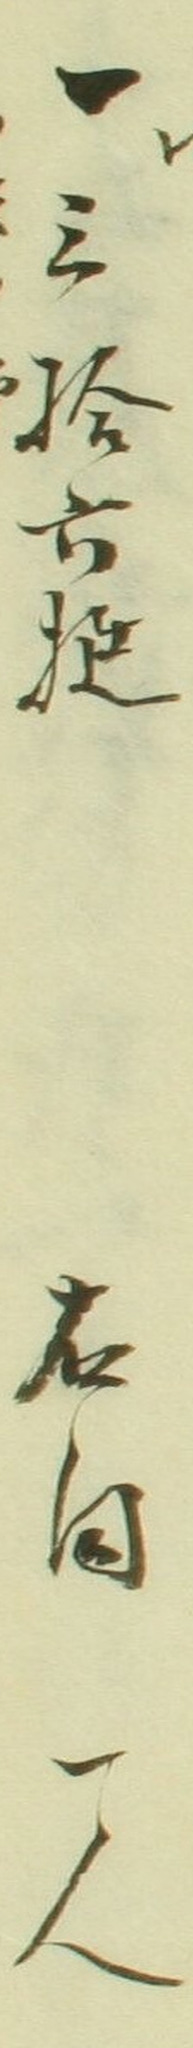一三拾六挺右同一人
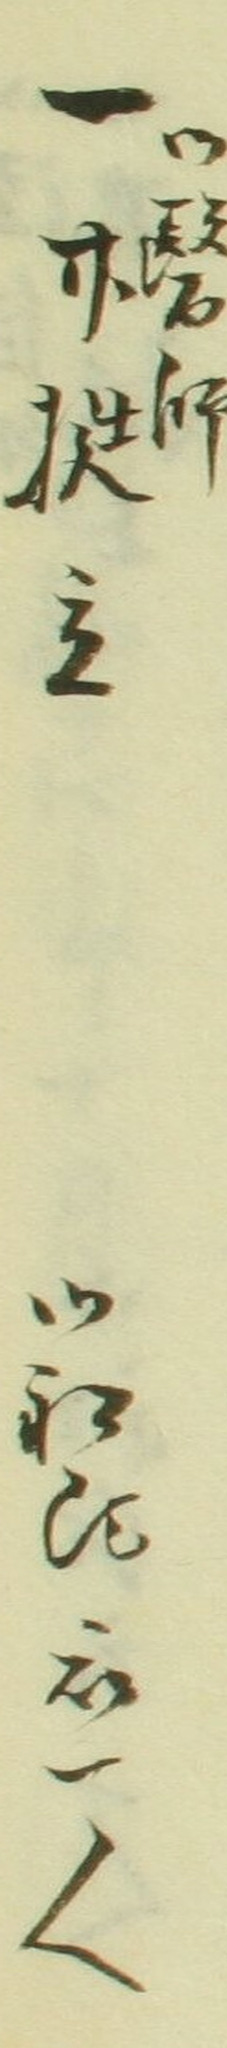一廿挺立御船頭衆一人

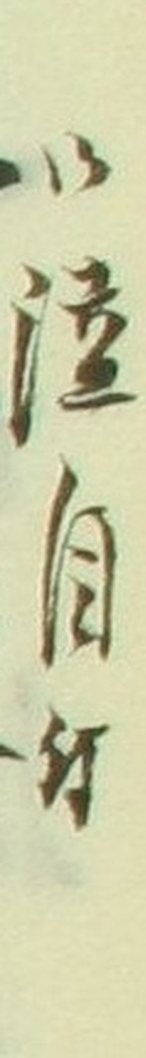御陸目付
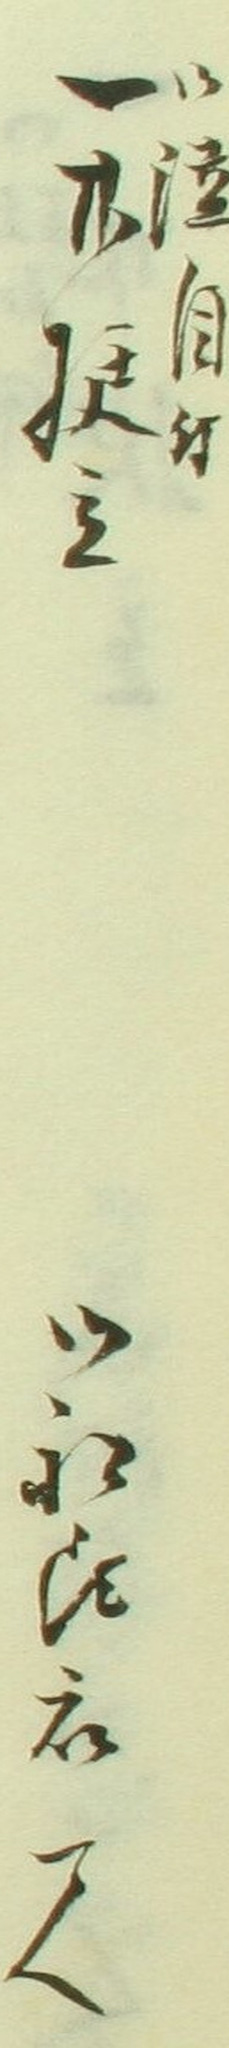一廿挺立御船頭衆一人
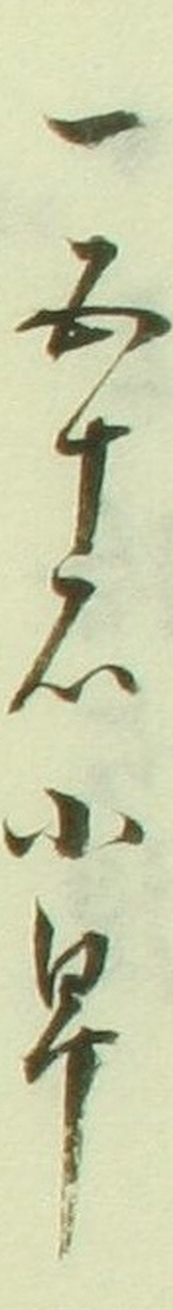一五十石小早
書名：異国船漂着記
